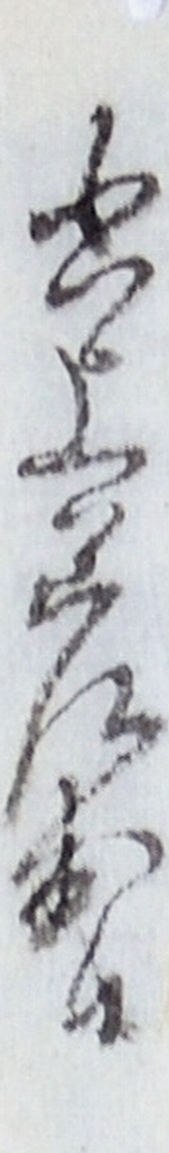書上差出候
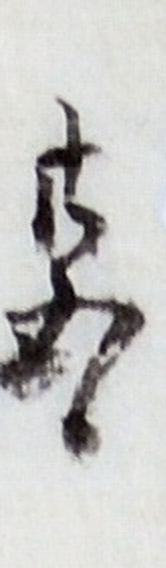廿五日
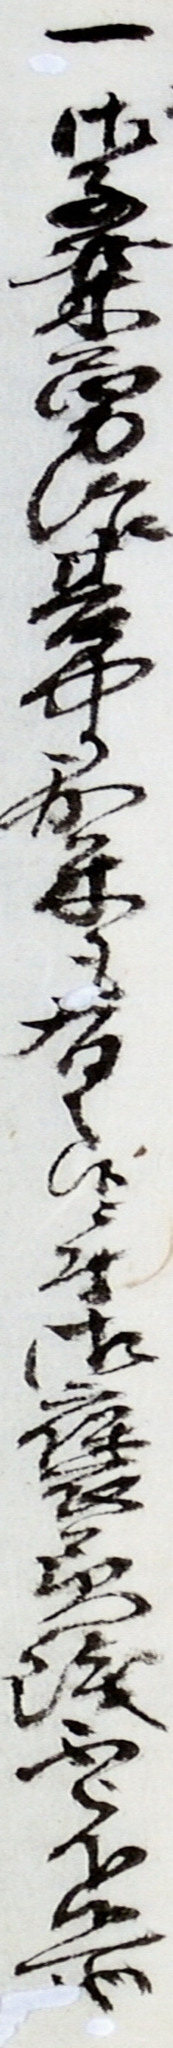一御子柴勇治春中御加米も有之候ニ付御褒美銭不被下御取
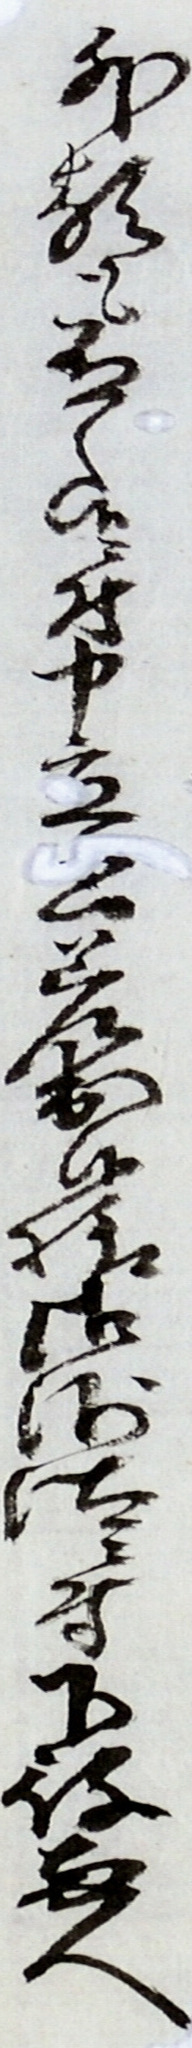其類も有之候ニ付申立差出候様御沙汰ニ付下役両人
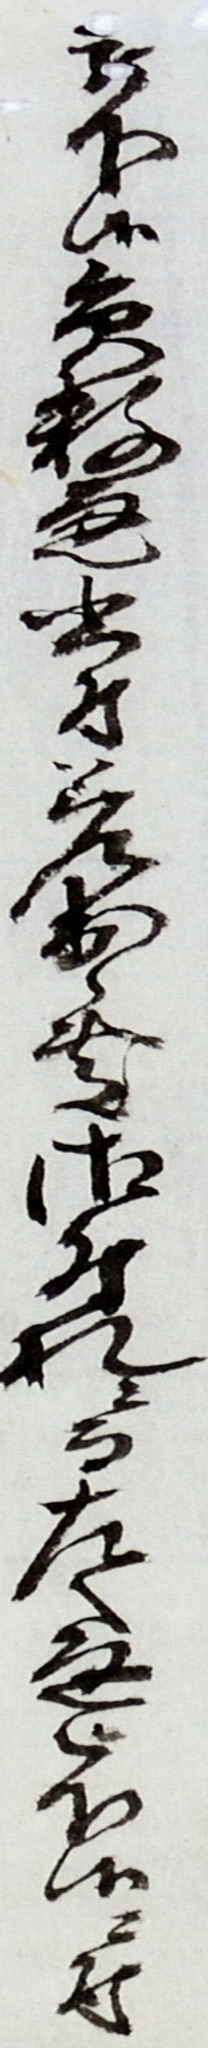被下候通書付差出候処御付札ニ而左之通被下候ニ付
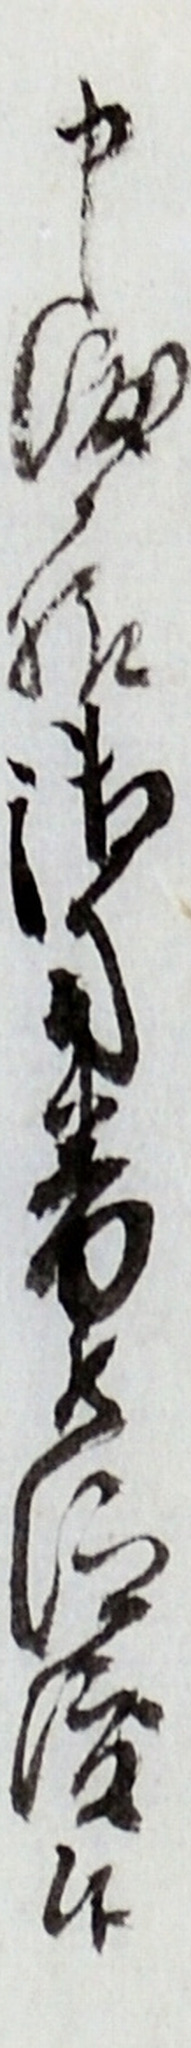申渡候様御用番被仰渡候
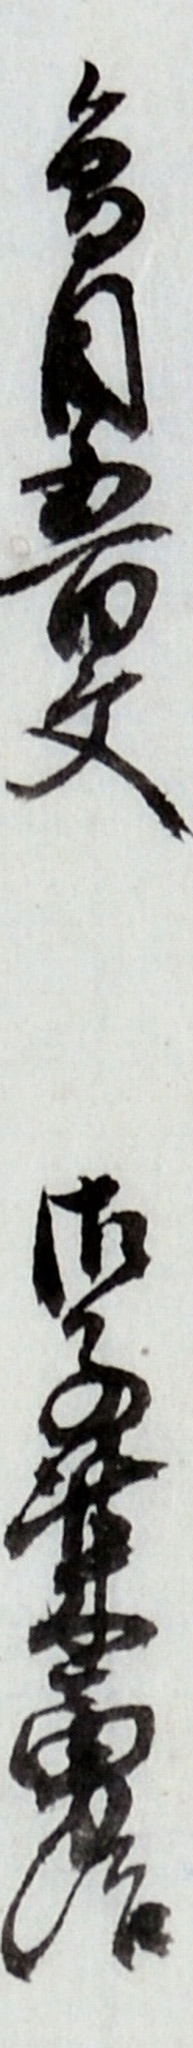鳥目五百文御子柴勇治
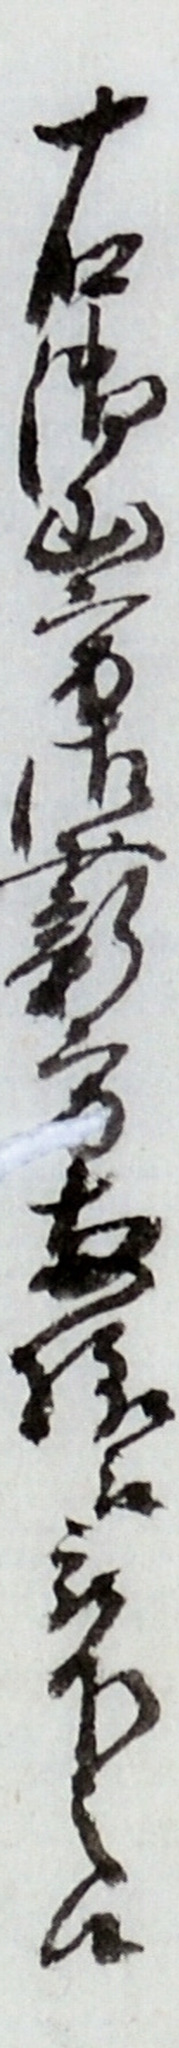右御山方御薪方両様江被下之候
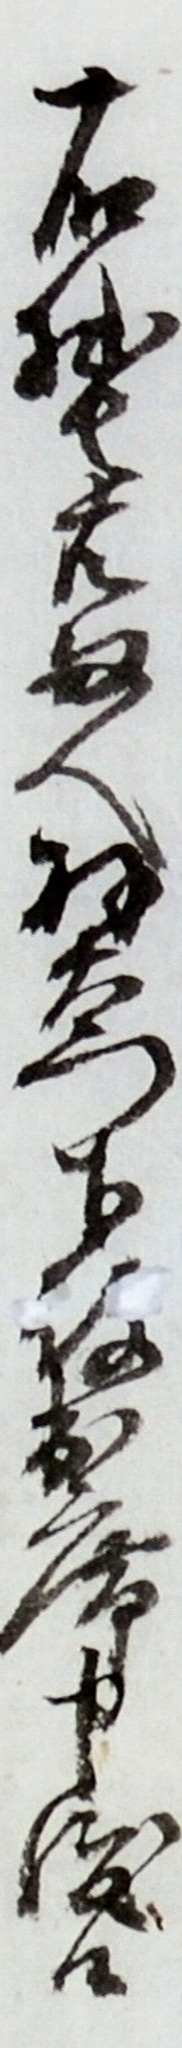右杣者共両人羽右衛門下約出席申渡候
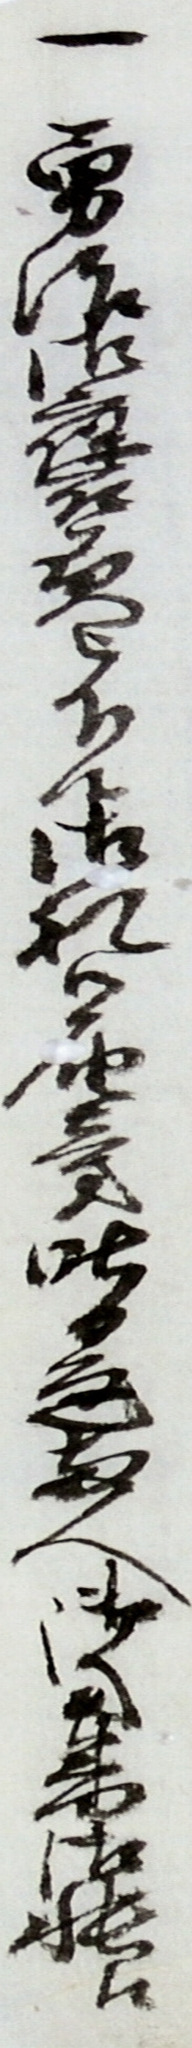一勇治御褒美被下候御礼御届昨日通両人御用番御帳江
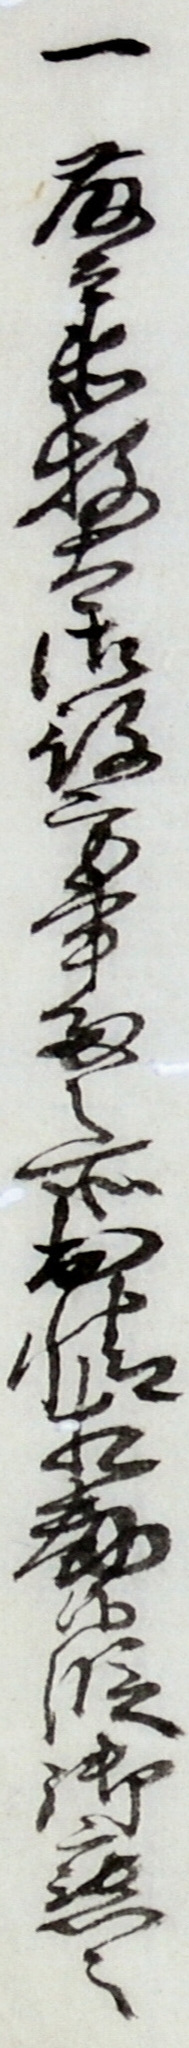一藤兵衛牧太御役方事多之所書帳相勤候段御懇々

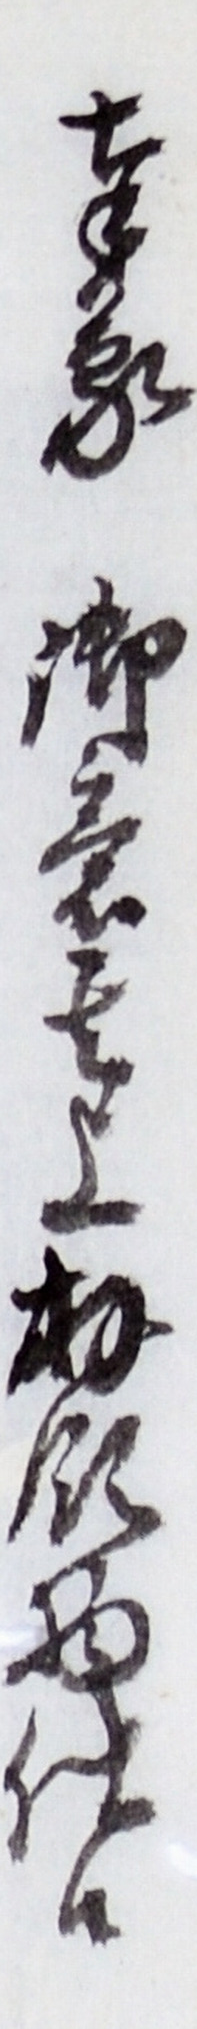奉畏御意其上拝領物仕候
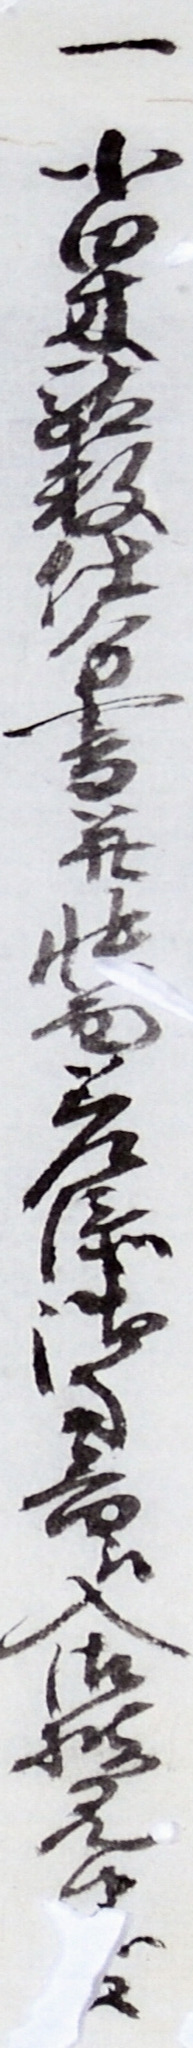一小田木駄数仕分并帳面差添御用番江入御披見候
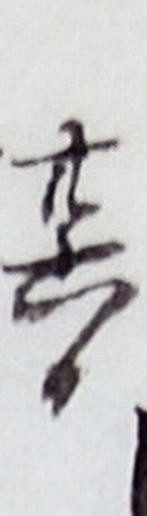廿六日
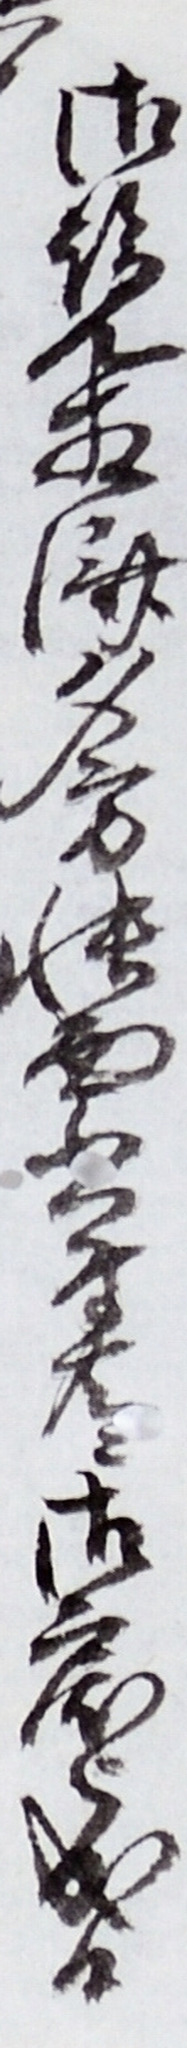御覧相済夕方帳面書付共ニ御戻被成候
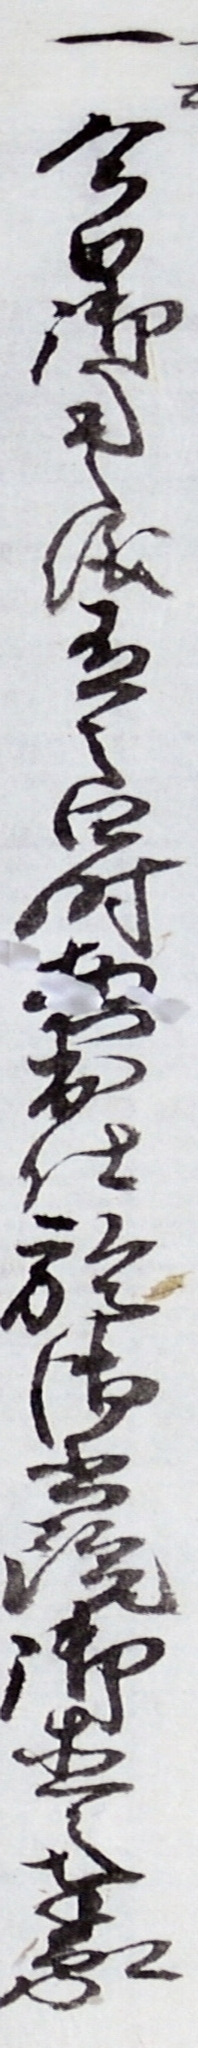一今日御用之儀有之四時惣出仕於御書院御直之奉
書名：御山奉行御用控
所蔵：伊那市立高遠町図書館・合同会社AMANE
